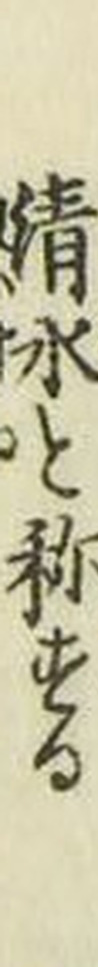清水と称する
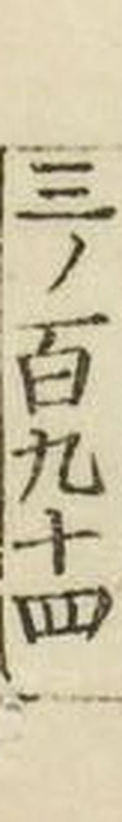三ノ百九十四
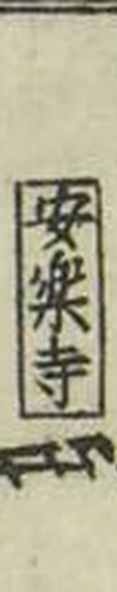安楽寺
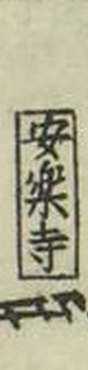安楽寺

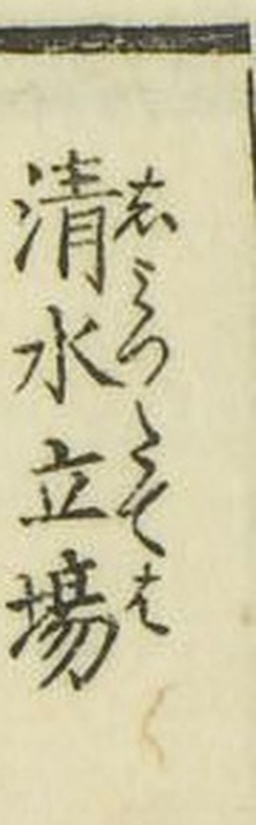清水立場
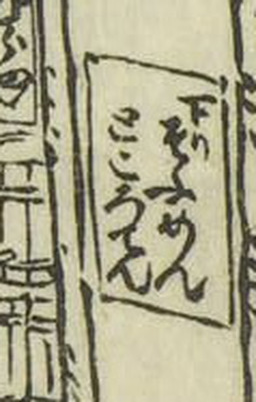ところてん
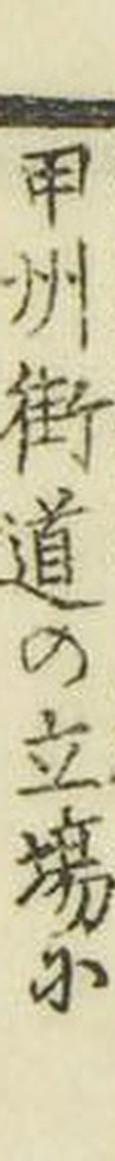甲州街道の立場に
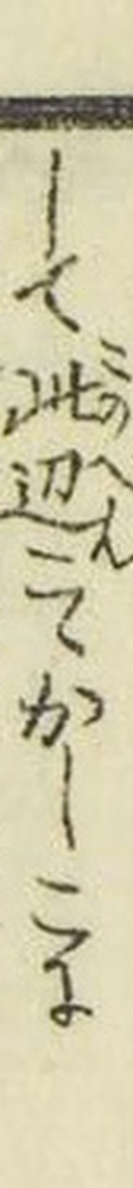して此辺こゝかしこに
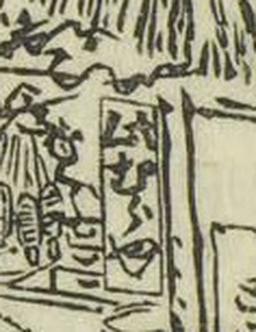此むらや
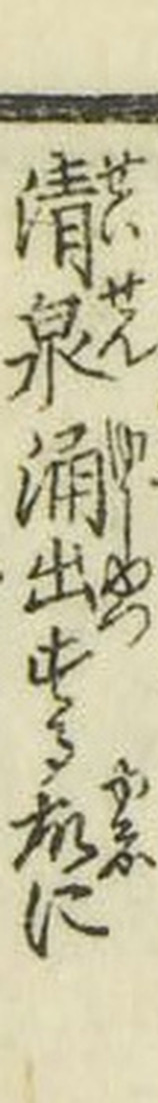清泉涌出する故に
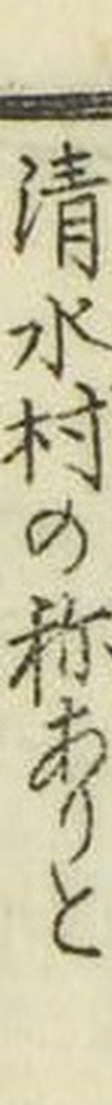清水村の称ありと
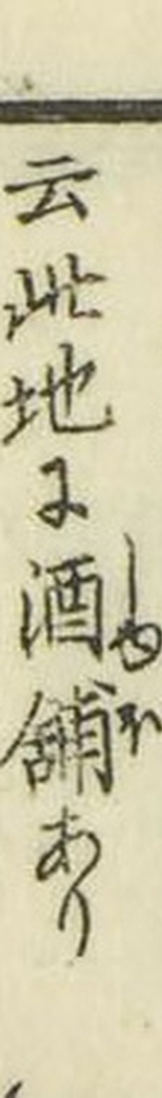云此地に酒舗あり
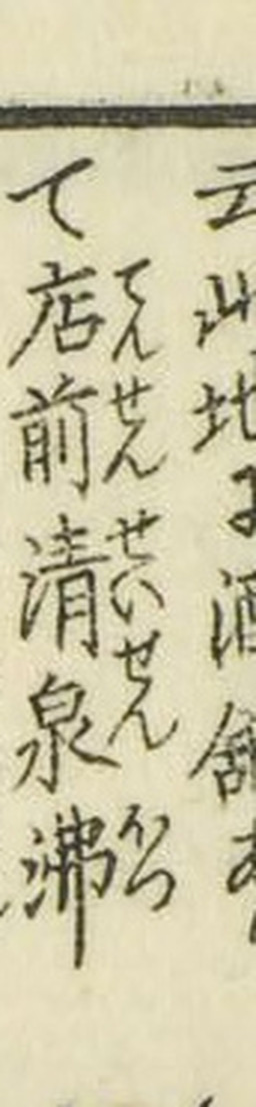て店前清泉沸
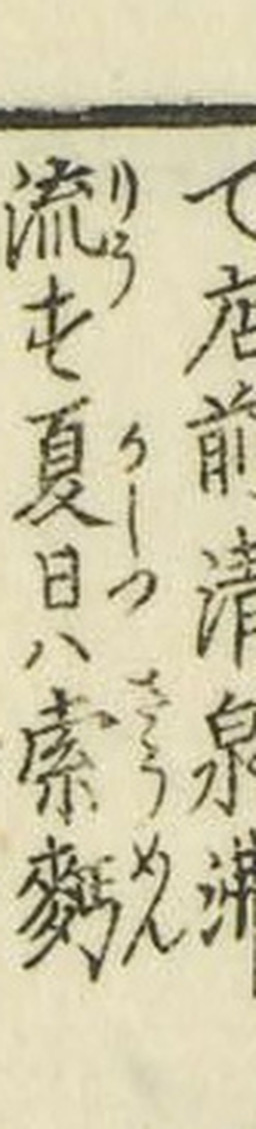流す夏日は索麺
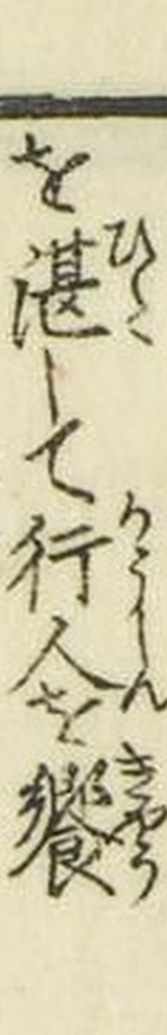を湛して行人を饗
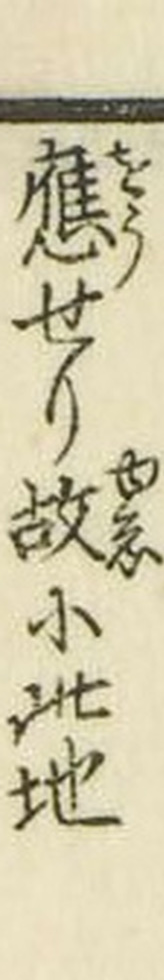応せり故に此地
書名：江戸名所図会 20巻 巻之10
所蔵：東京学芸大学教育コンテンツアーカイブ
